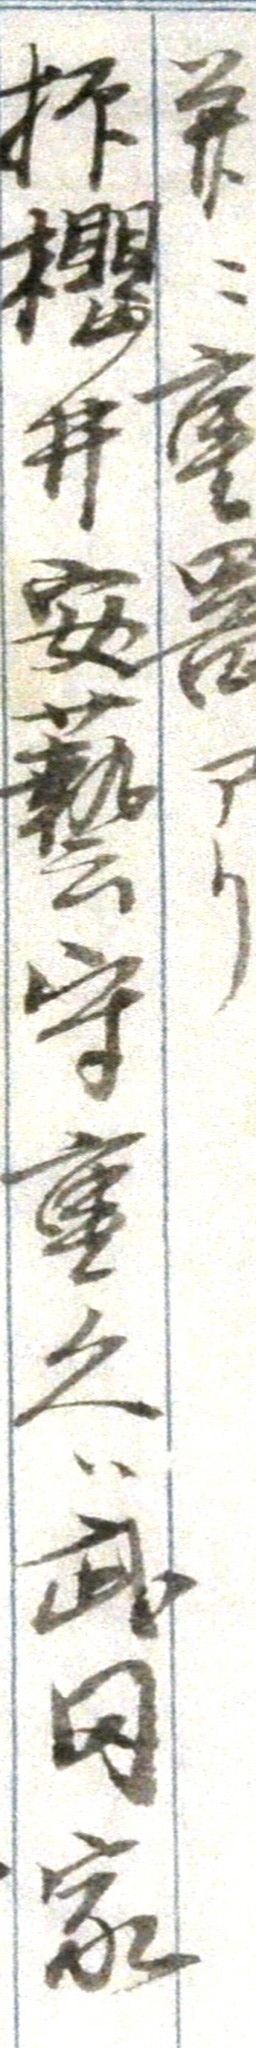抑桜井安芸守重久ハ武田家
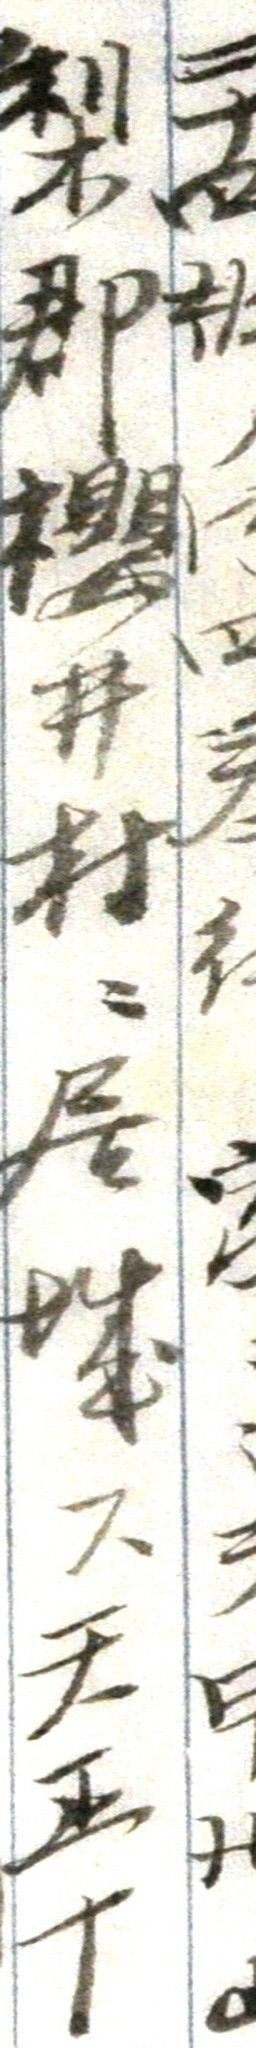梨郡桜井村ニ居城ス天正十
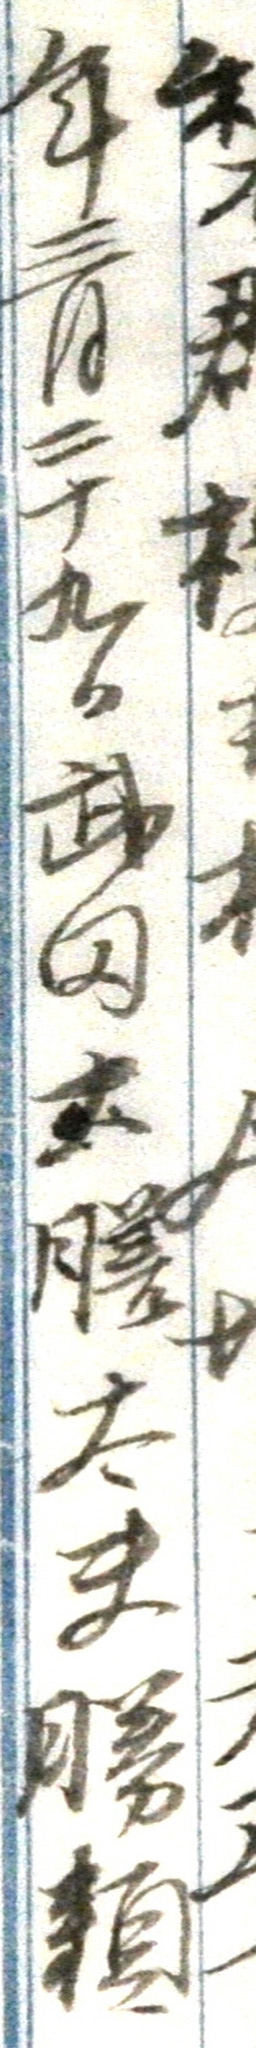年三月二十九日武田大膳太夫勝頼
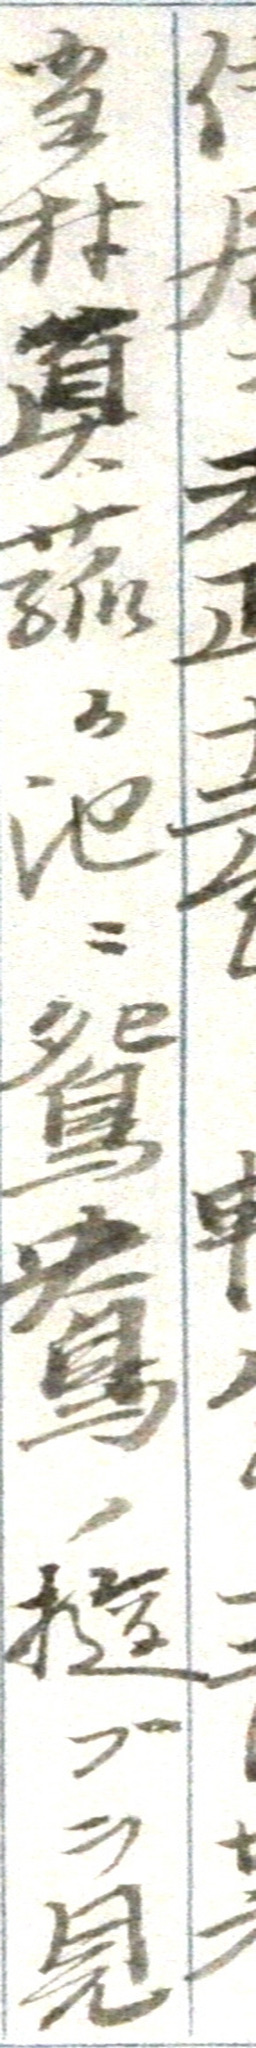当村真菰か池ニ鴛鴦ノ遊ブヲ見
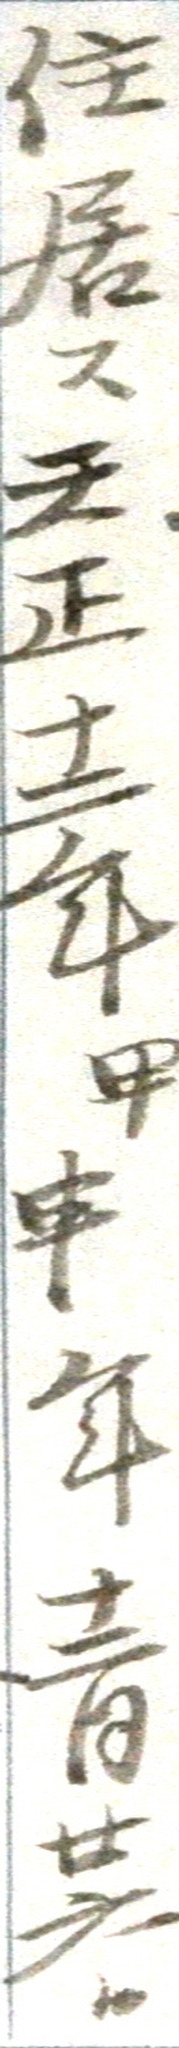住居ス天正十二年甲申年十二月廿六日
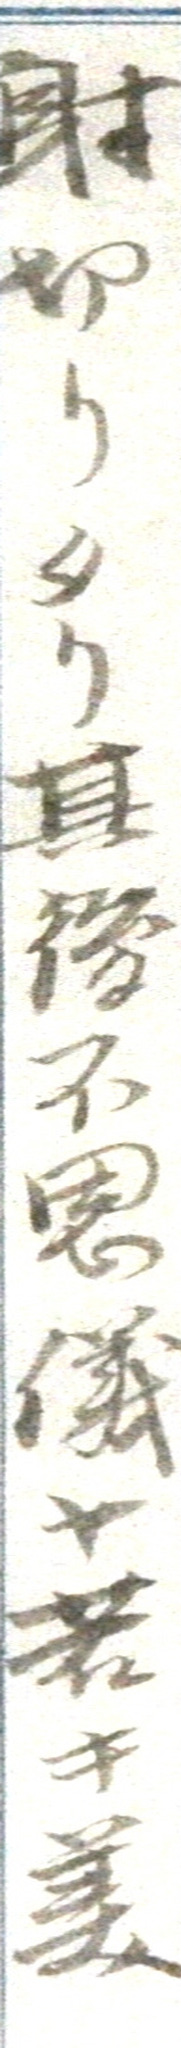射切リタリ其後不思儀ヤ若キ美
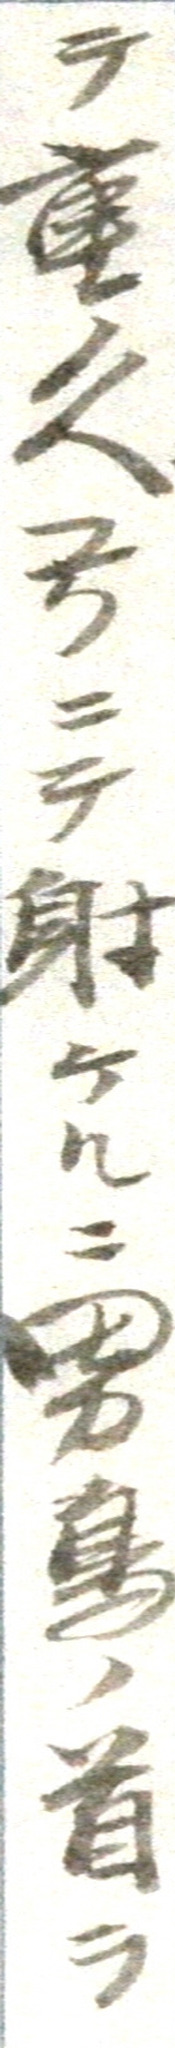テ重久弓ニテ射ケルニ男鳥ノ首ヲ
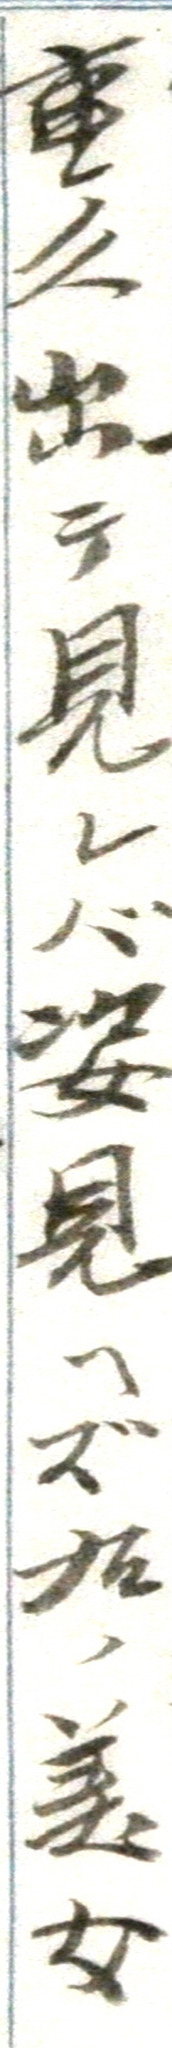重久出テ見レバ姿見ヘズ右ノ美女
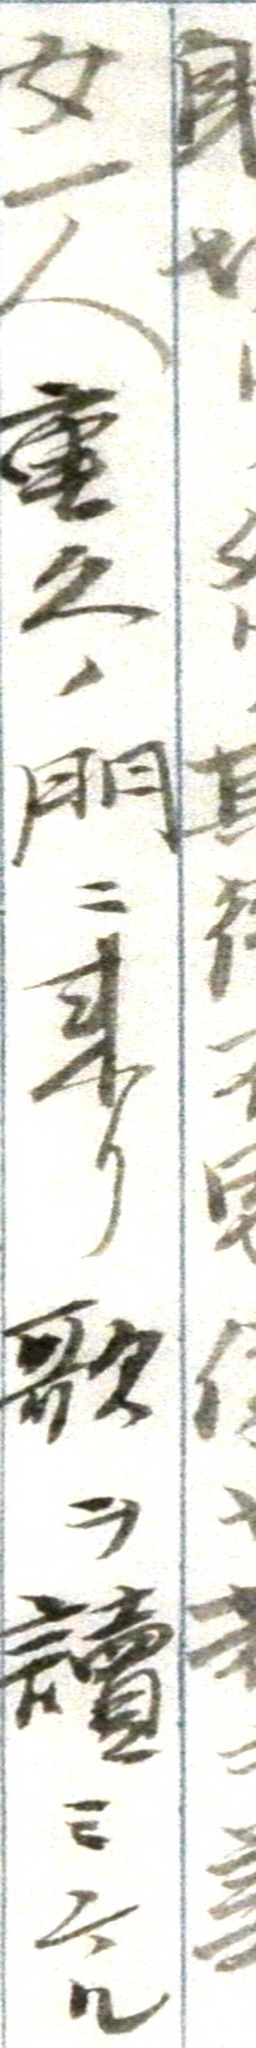女一人重久ノ門ニ来リ歌ヲ読ミケル
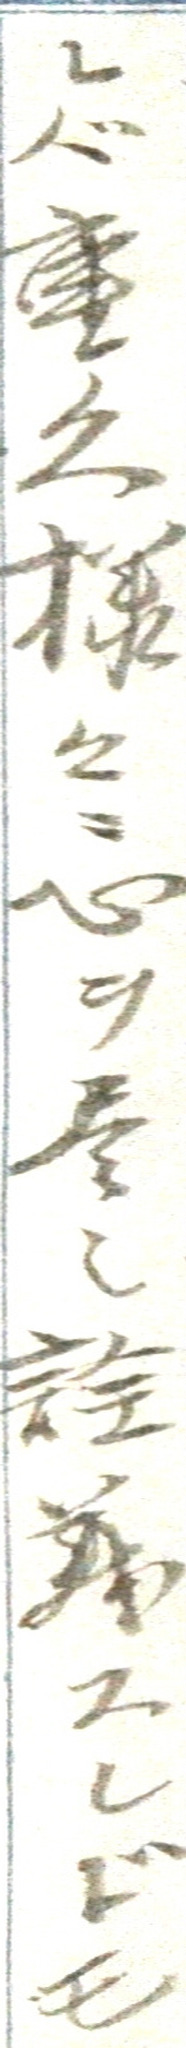レバ重久様々ニ心ヲ尽シ詮義スレドモ
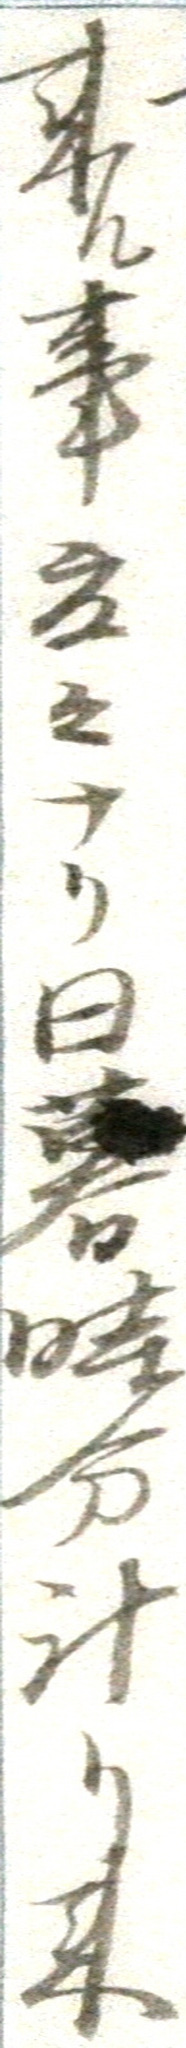来ル事度々ナリ日暮時分計リ来
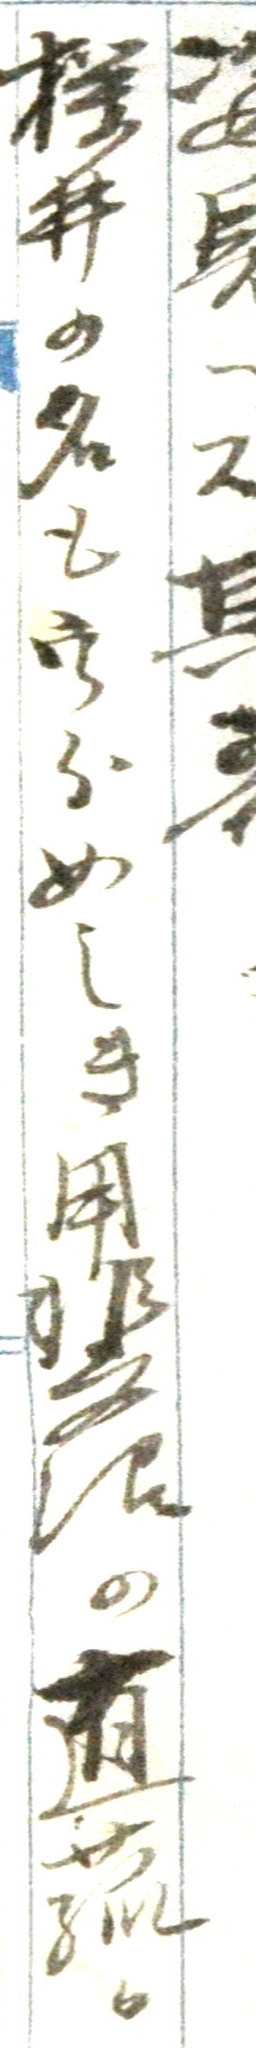桜井の名もうらめしき甲斐沼の真菰か

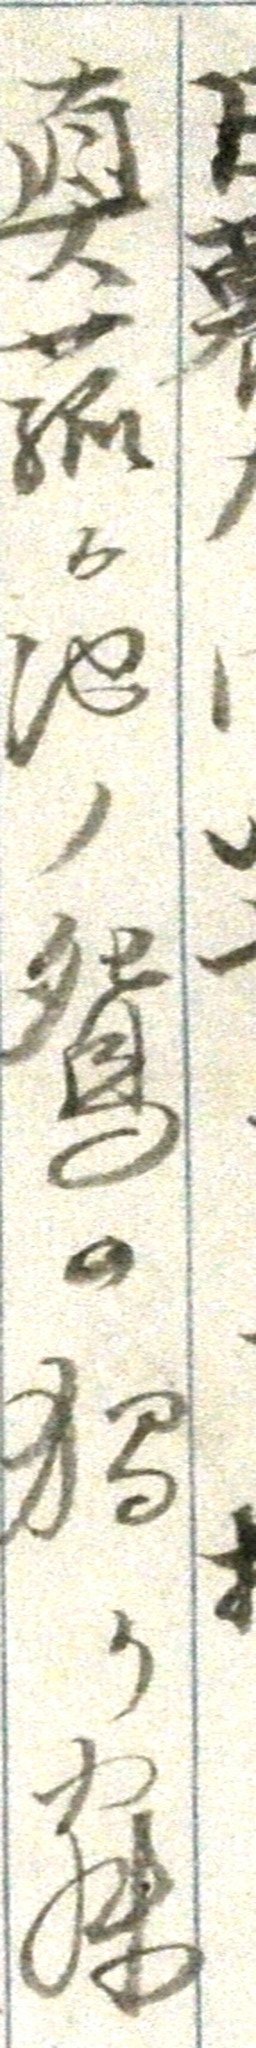真菰か池ノ鴛か独り寝
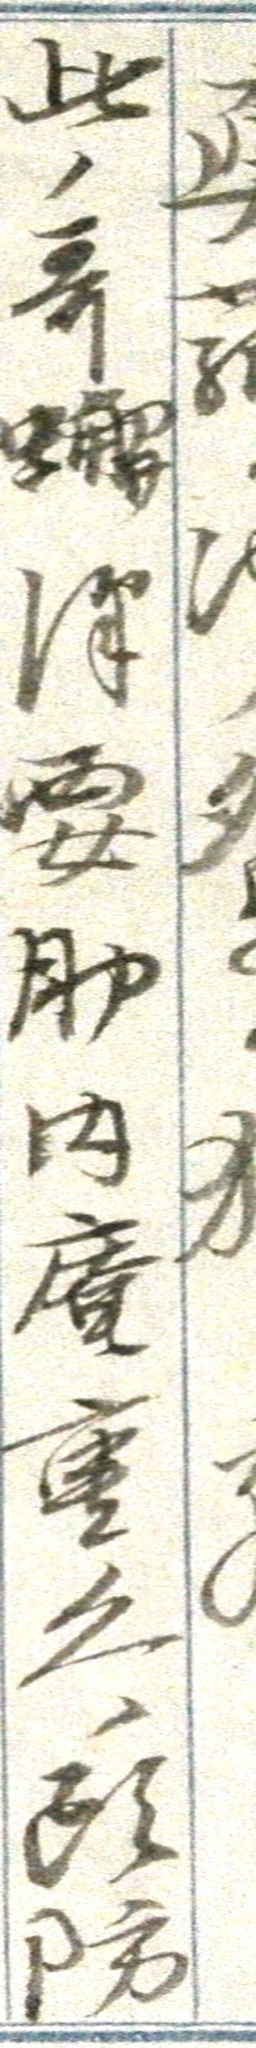此ノ歌蠏澤要助内庵重久ノ頭防
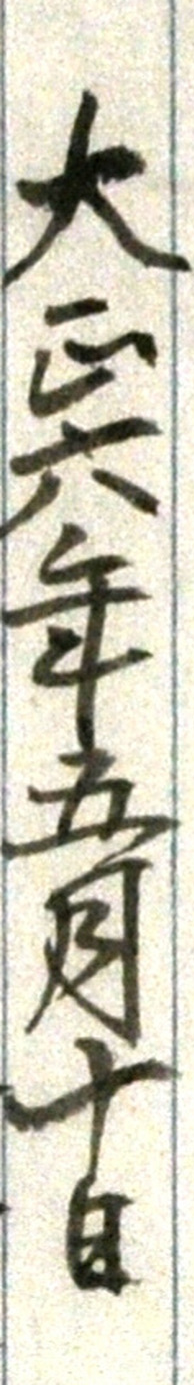大正六年五月十日
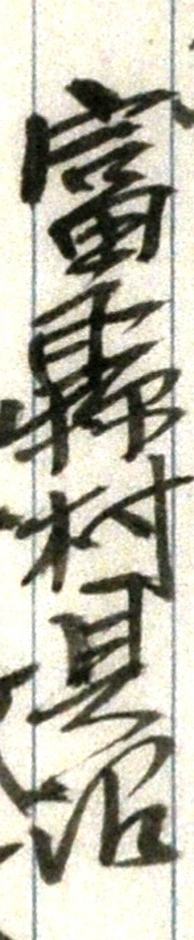富県村貝沼
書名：桂泉院・樹林寺・東光寺縁起書、蓮華寺由来書、付夕顔観音記
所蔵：伊那市立高遠町図書館・合同会社AMANE
